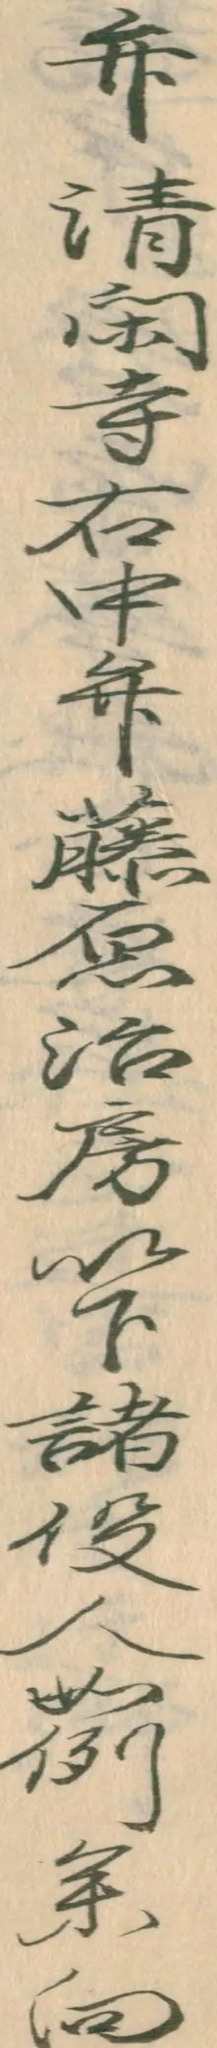弁清閑寺右中弁藤原治房以下諸役人如例参向
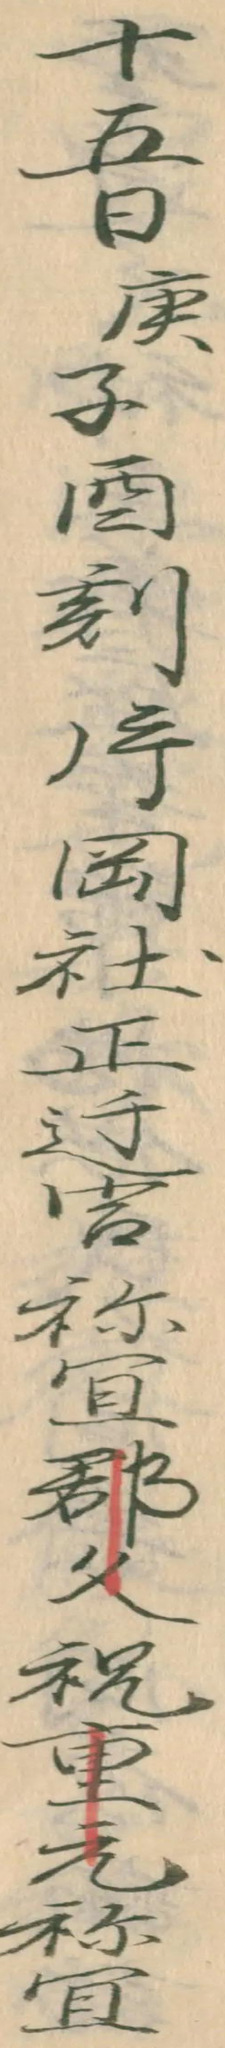十五日庚子酉刻片岡社正迁宮祢宜郡久祝重元祢宜
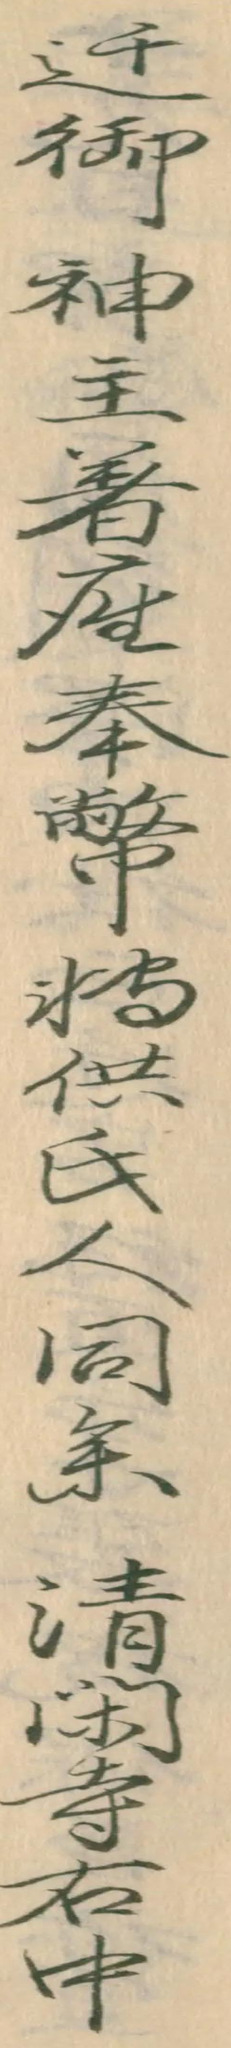迁御神主着座奉幣転供氏人同参清閑寺右中
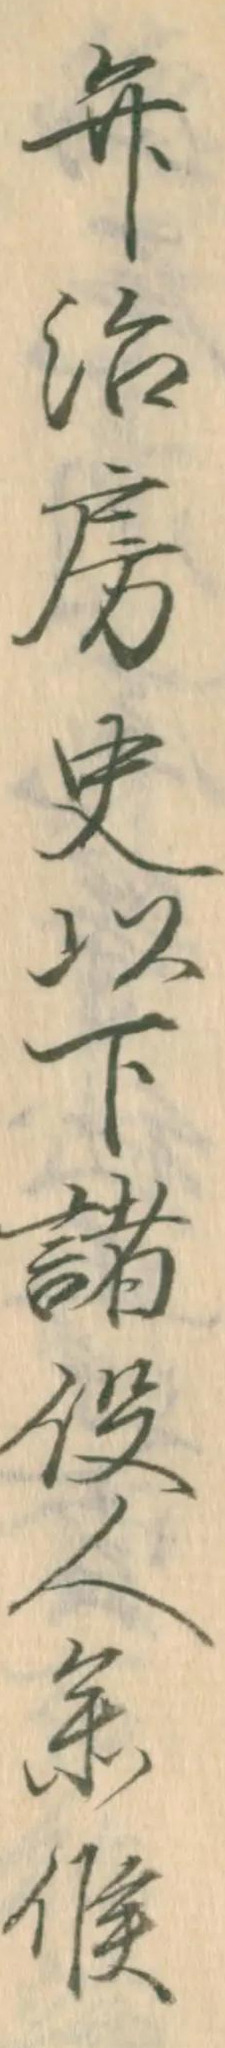弁治房史以下諸役人参候
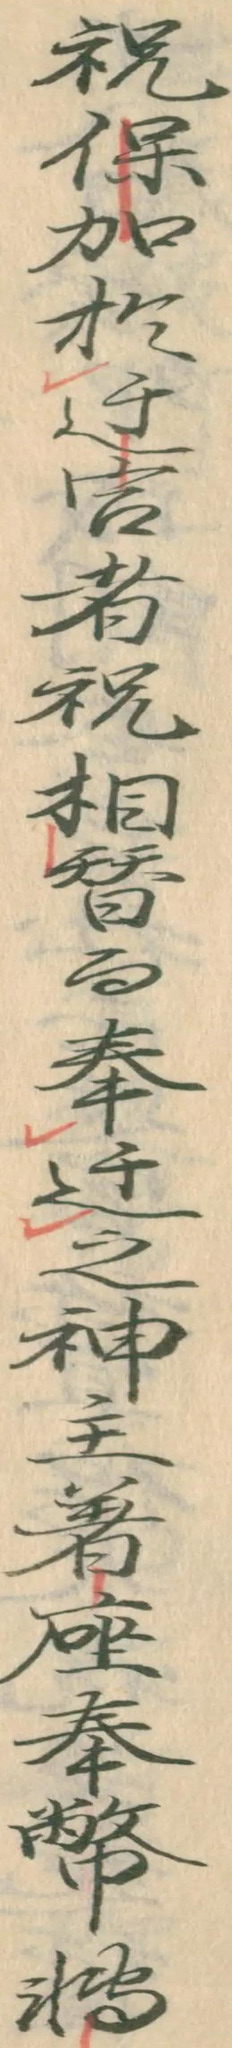祝保加於迁-宮者祝相-替而奉迁之神主着-座奉幣転-
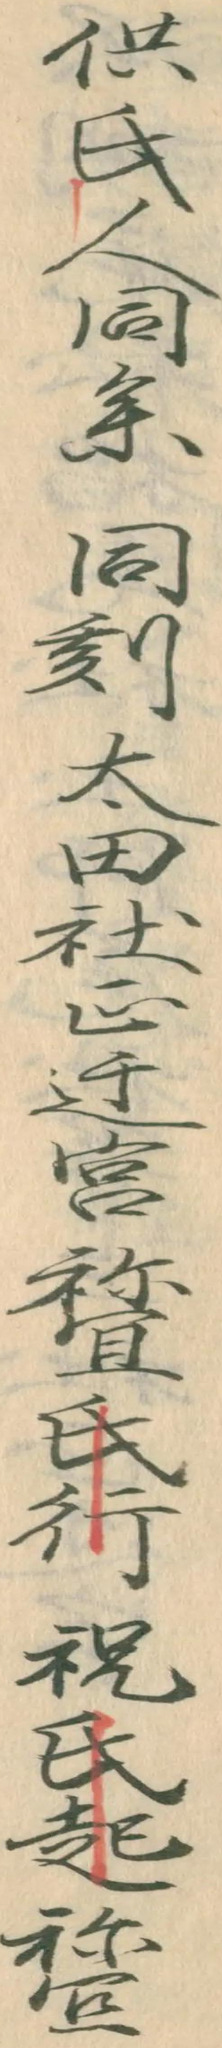供氏同参同刻太田社正迁宮祢宜氏行祝氏起祢宜

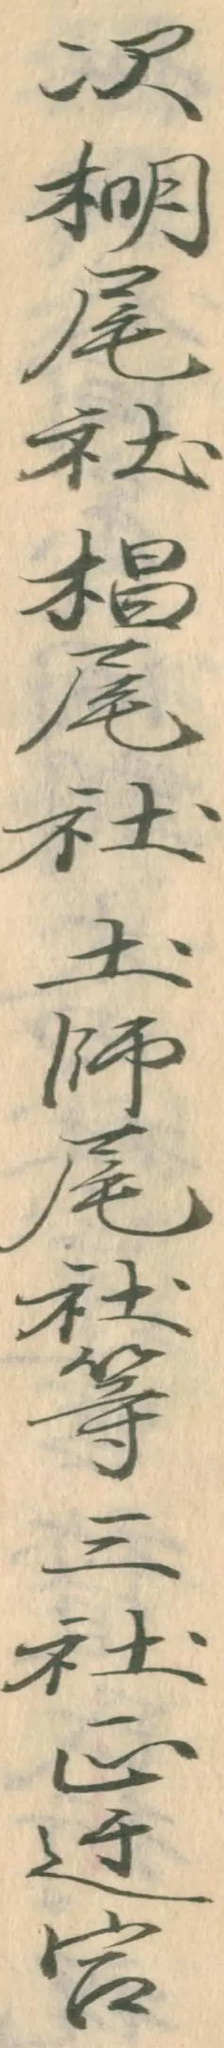次棚尾社椙尾社土師尾社等三社正迁宮
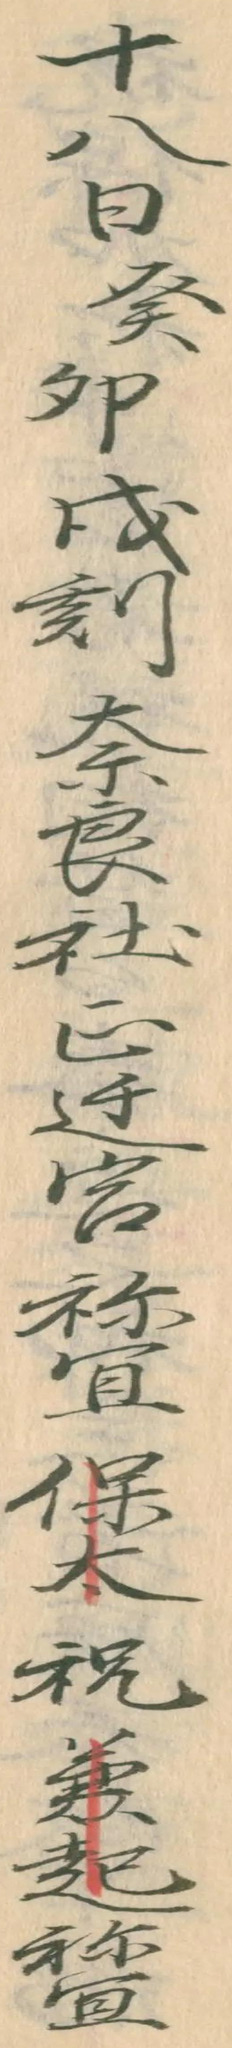十八日癸卯戌刻奈良社正迁宮祢宜保大祝兼起祢宜
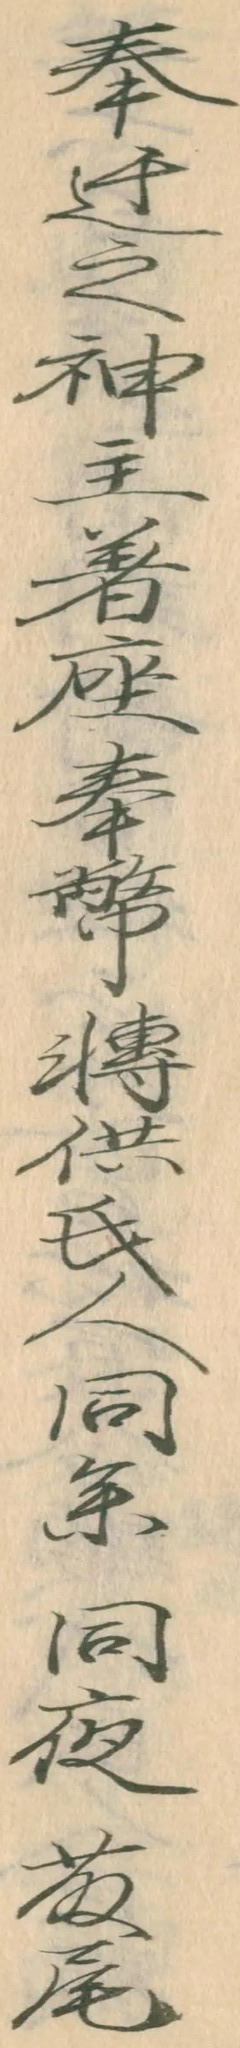奉迁之神主着座奉幣転供氏人同参同夜藤尾
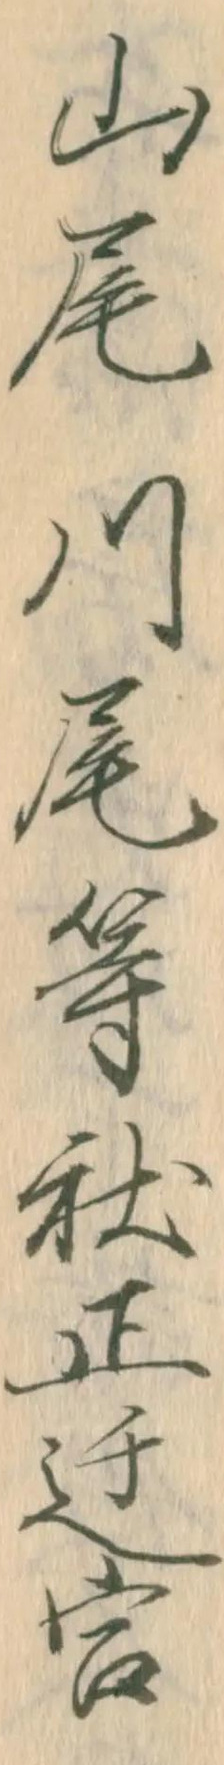山尾川尾等社正迁宮
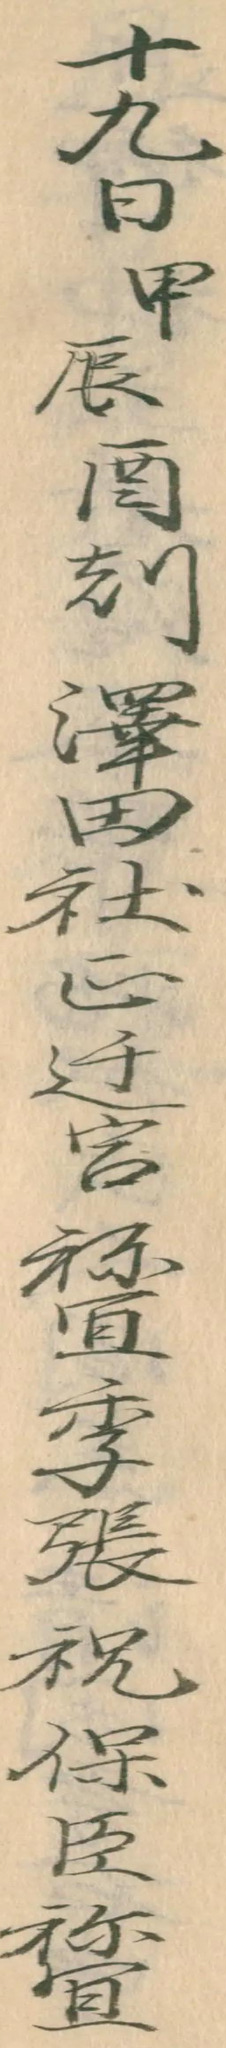十九日甲辰酉刻沢田社正迁宮祢宜季張祝保臣祢宜
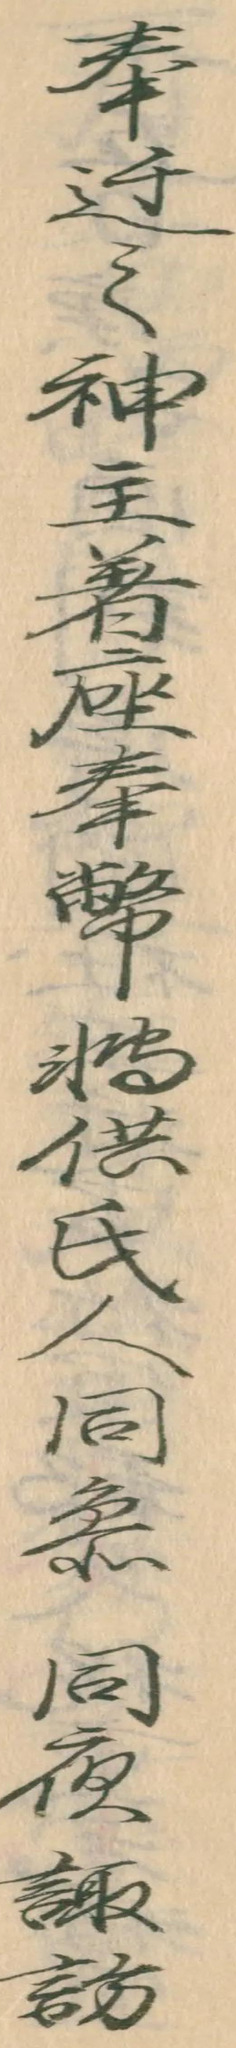奉迁之神主着座奉幣転供氏人同参同夜諏訪
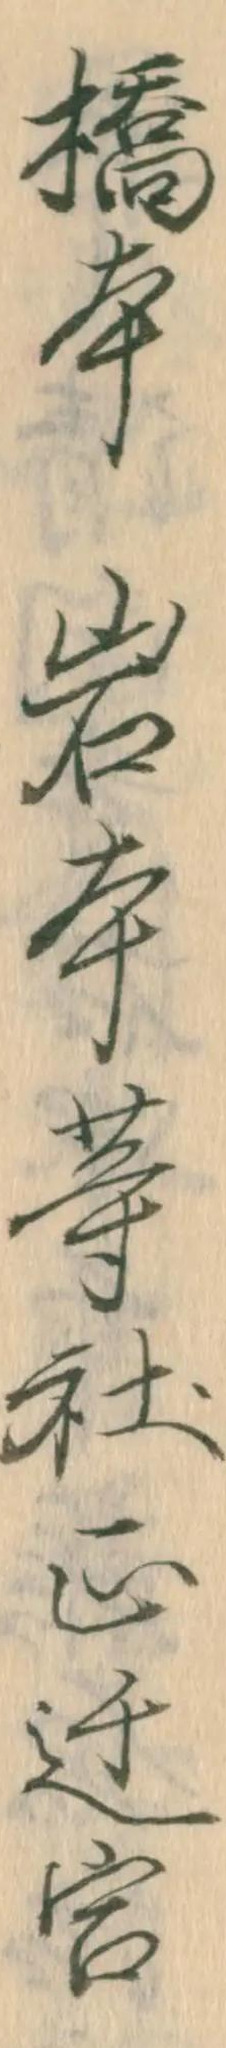橋本岩本等社迁宮
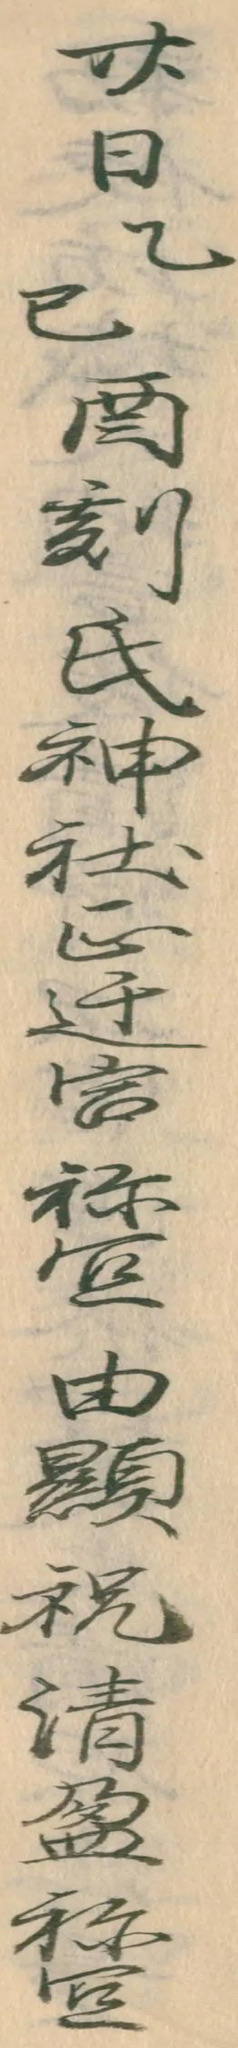廿日乙巳酉刻氏神社正迁宮祢宜由顕祝清盈祢宜
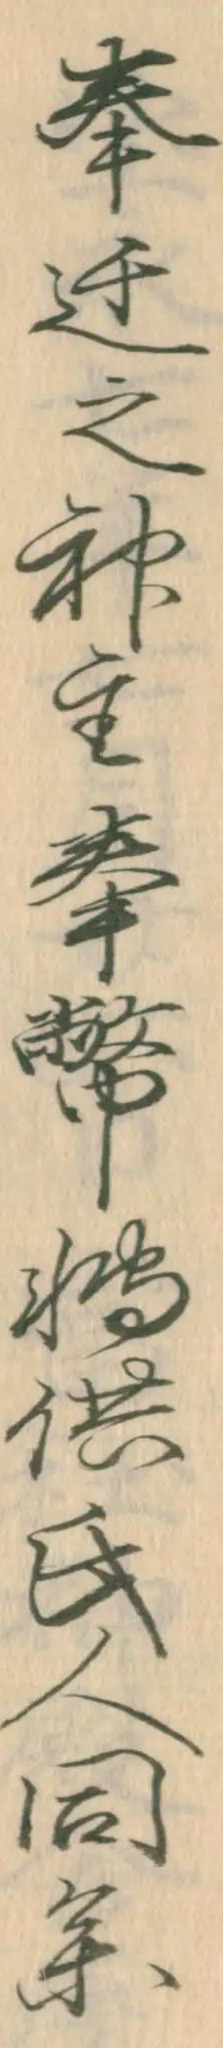奉迁之神主奉幣転供氏人同参
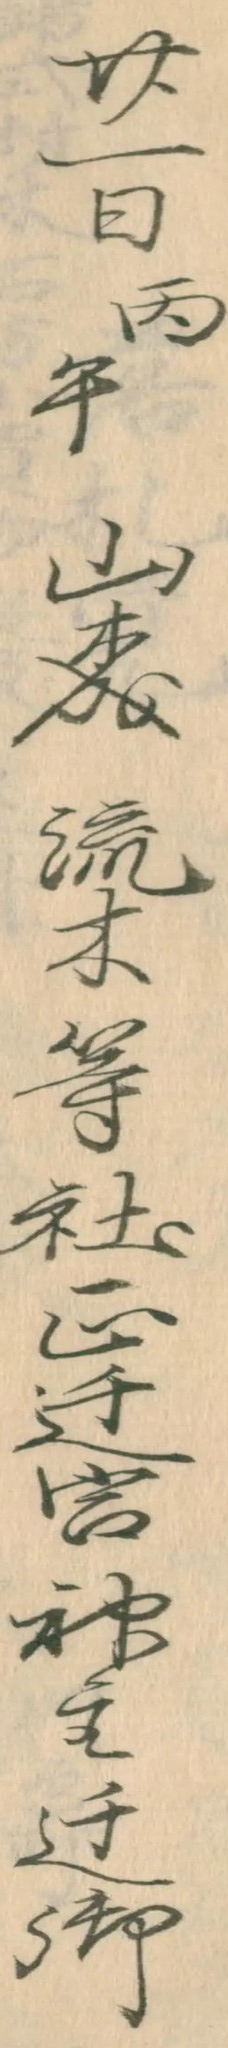廿一日丙午山森流木等社正迁宮神主迁御
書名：賀茂社記録. 第15冊
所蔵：国立国会図書館 National Diet Library, JAPAN
